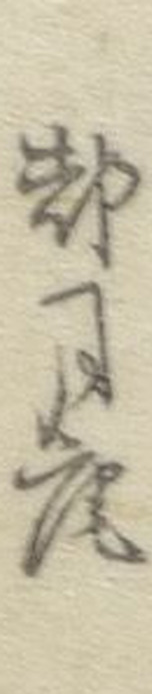都月庵
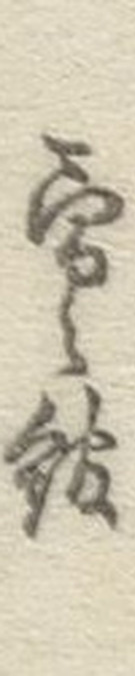勇々館
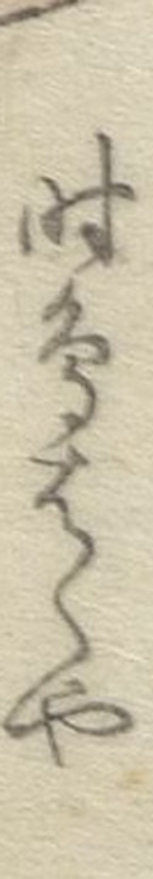時鳥はくや
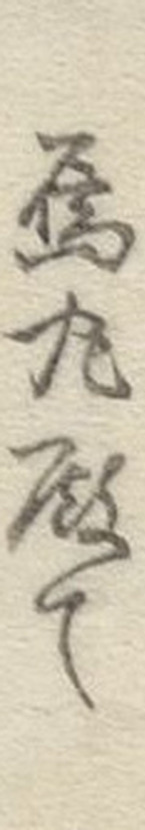烏丸殿て
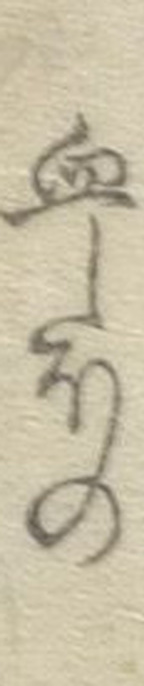血しほの
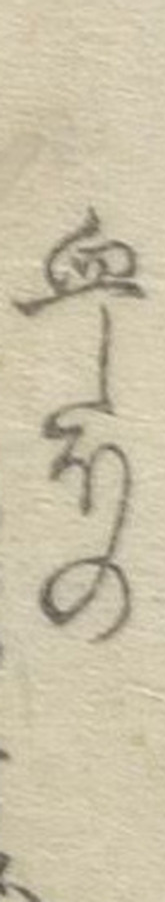血しほの
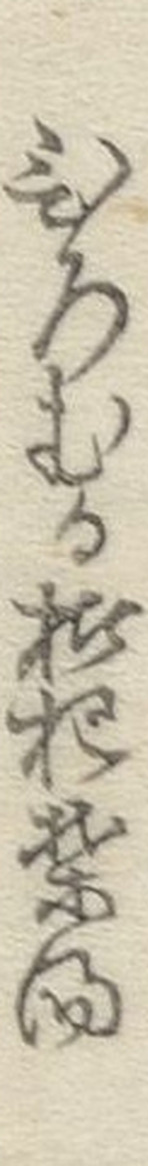ひろむる琵琶葉湯
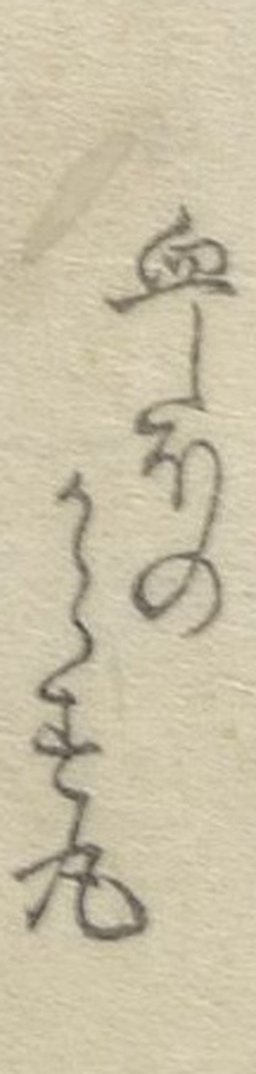からす丸
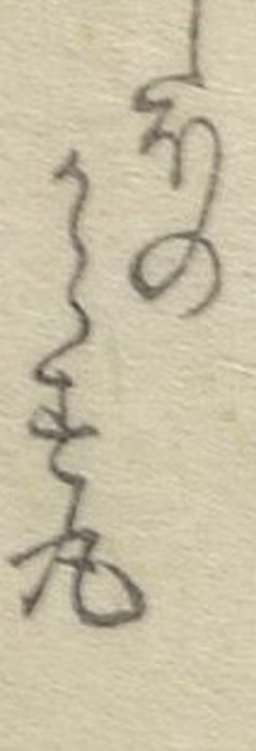からす丸
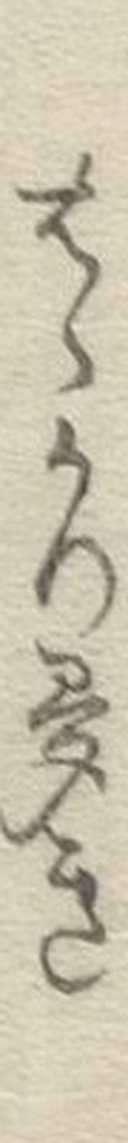はゝかり多き
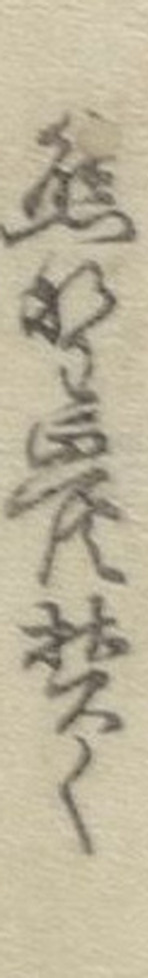熊野炭焚く
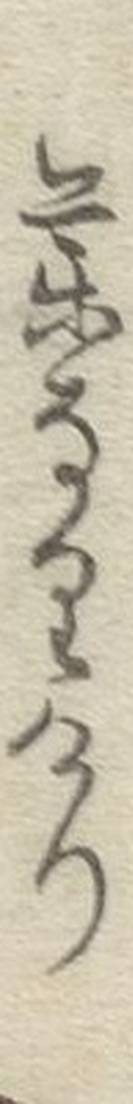薬なりけり
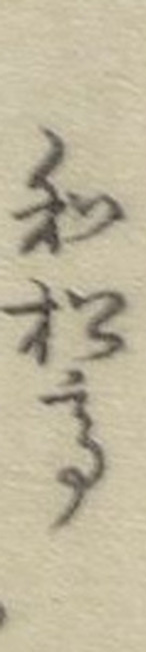和松亭

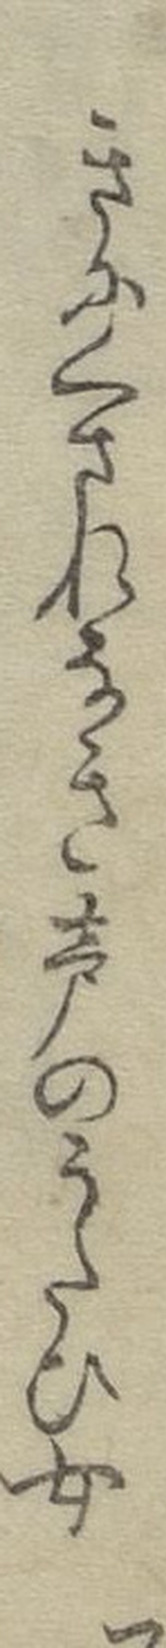きにくされなき声のうたひ女道草
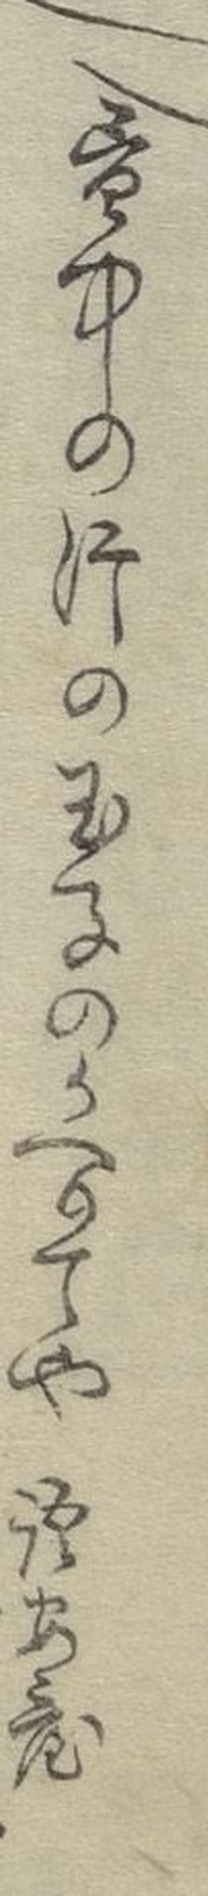昼中の汗の玉子のかへもてや語安台
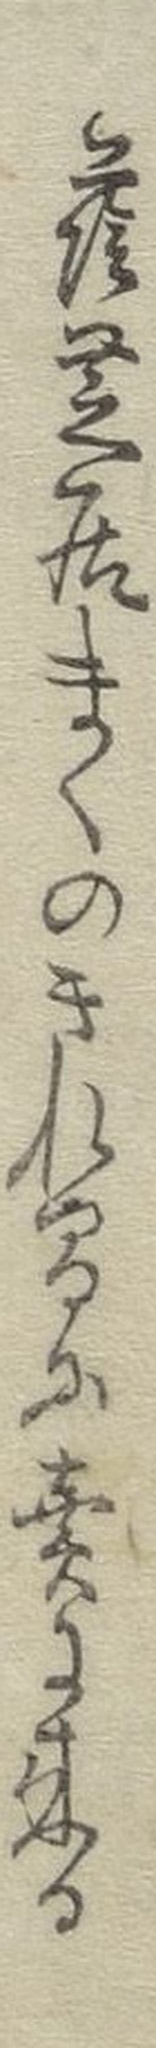蔭芝居まくのきれ間に売に来る
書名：Picture Album of People with Kyōka (Light Verse) (Kyōka shiki jinbutsu 狂歌四季人物)
